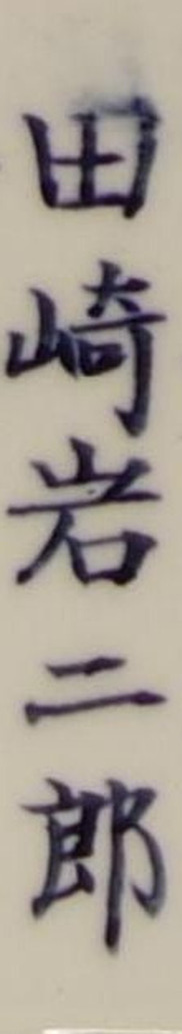田崎岩二郎
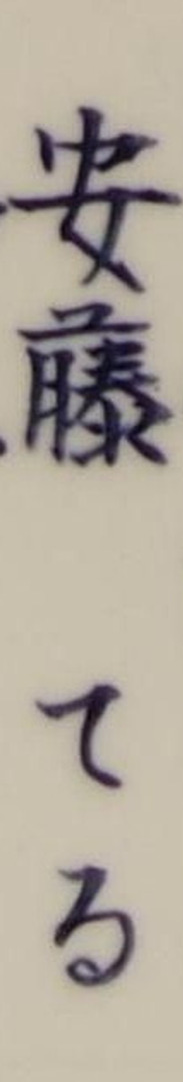安藤てる
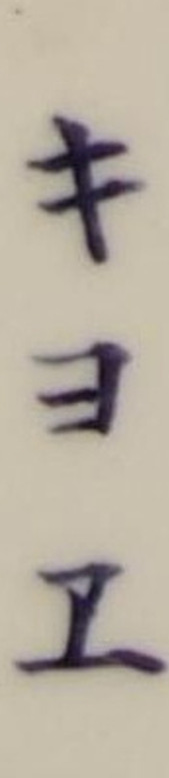キヨヱ
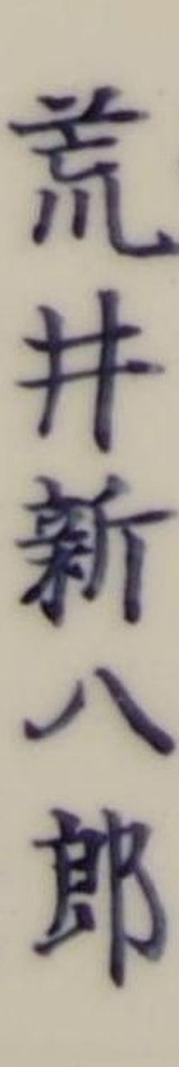荒井新八郎
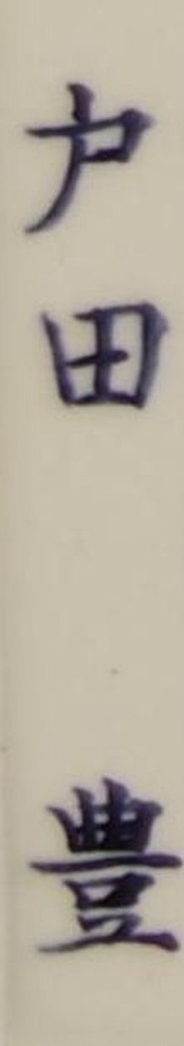戸田豊

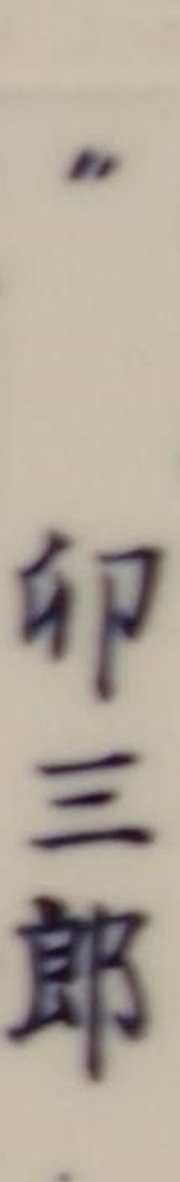卯三郎
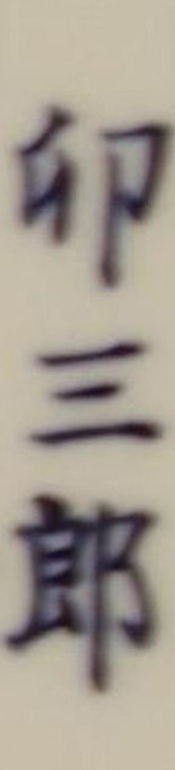卯三郎
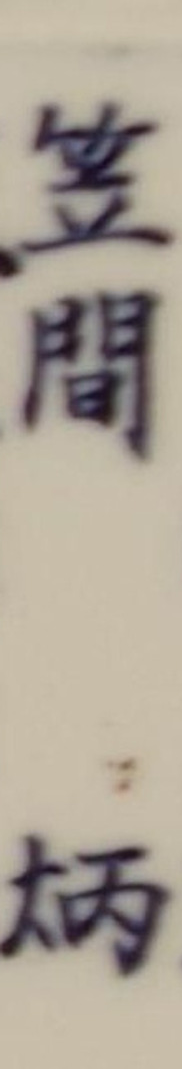笠間炳
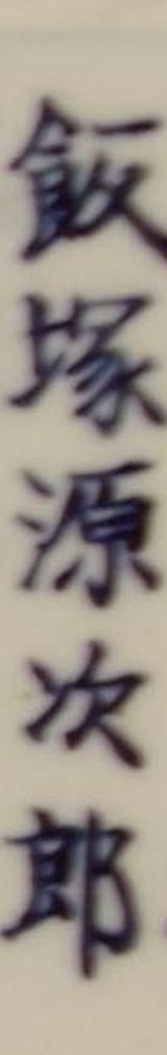飯塚源次郎
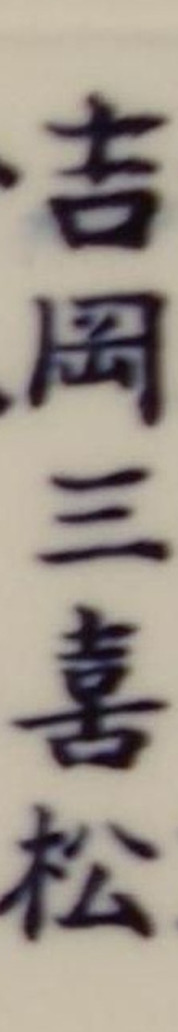吉岡三喜松
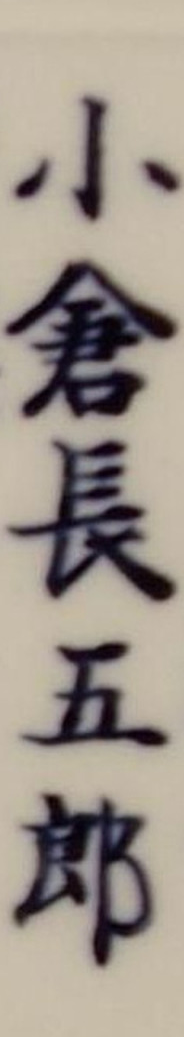小倉長五郎
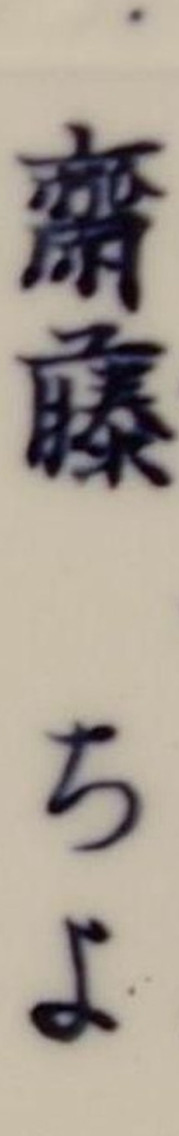斎藤ちよ
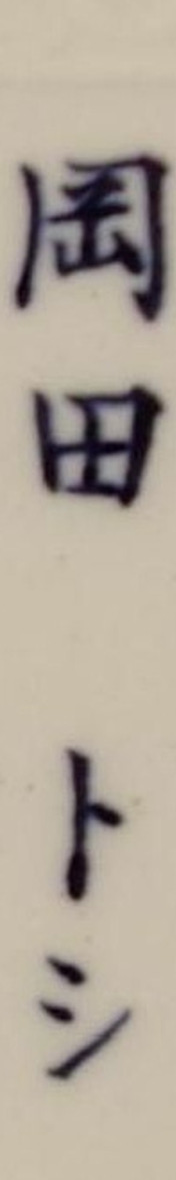岡田トシ
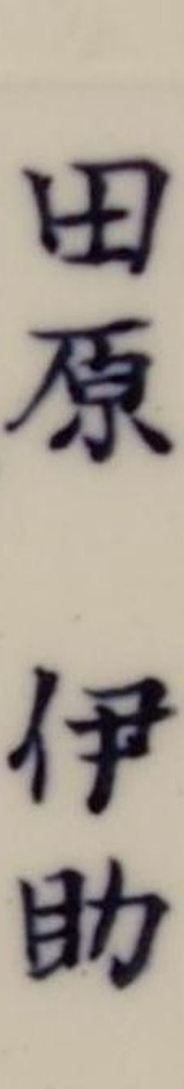田原伊助
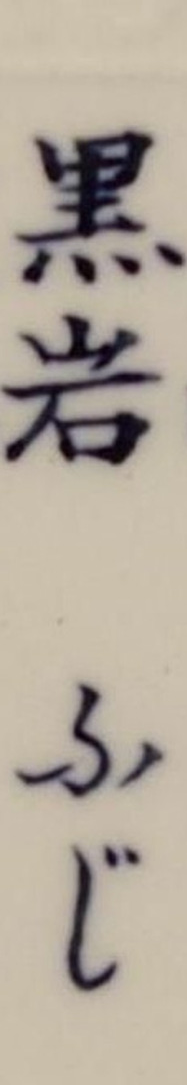黒岩ふじ
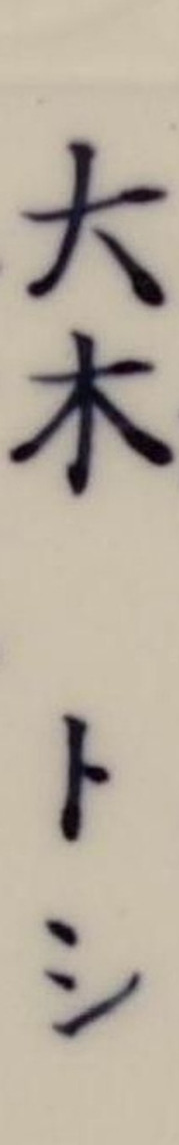大木トシ
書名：M~S
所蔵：高野山金剛峯寺
